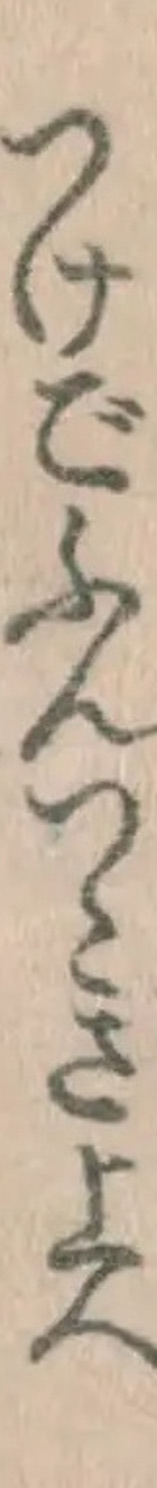つけごふんつゝき上へ
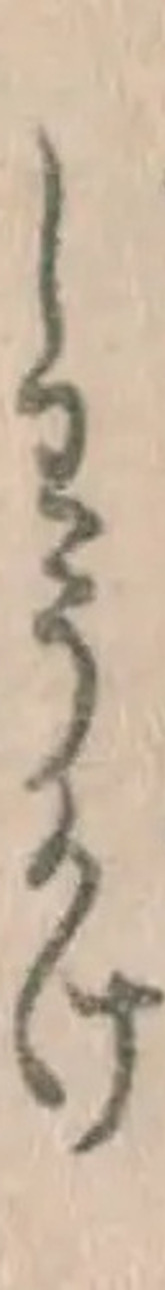しわうかけ
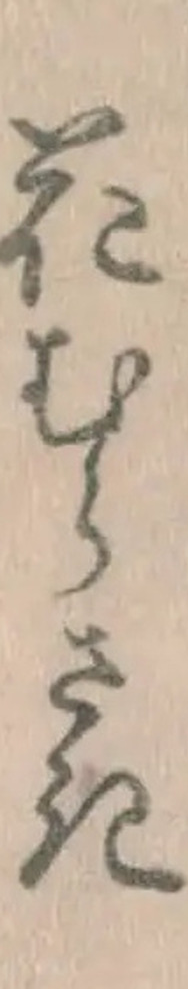花むらさき
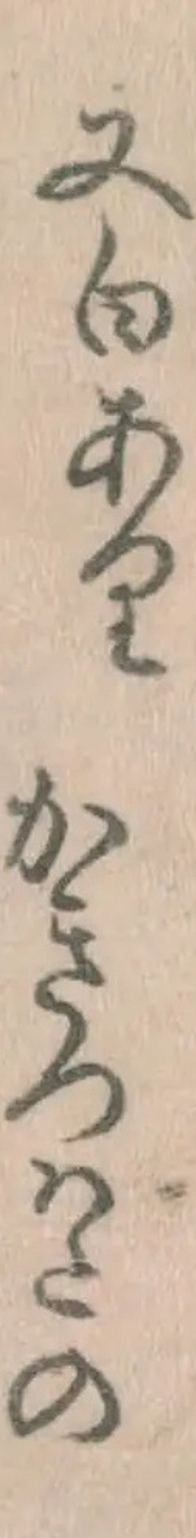又白ありかきつはた
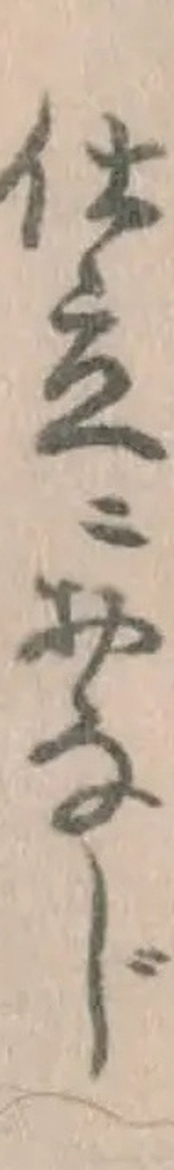仕立におなじ
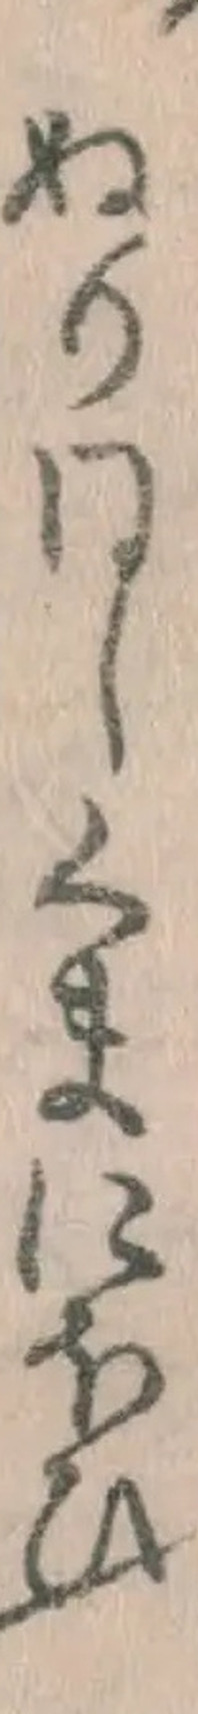ぬり同しくまにほひ
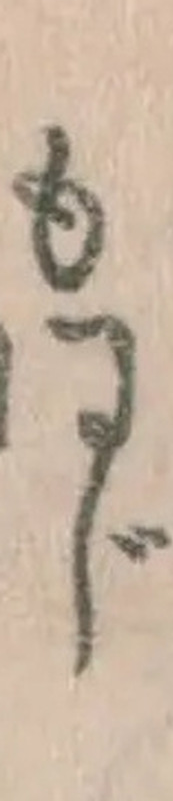も同じ
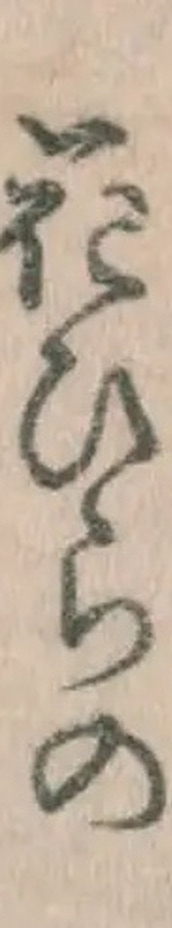花ひらの
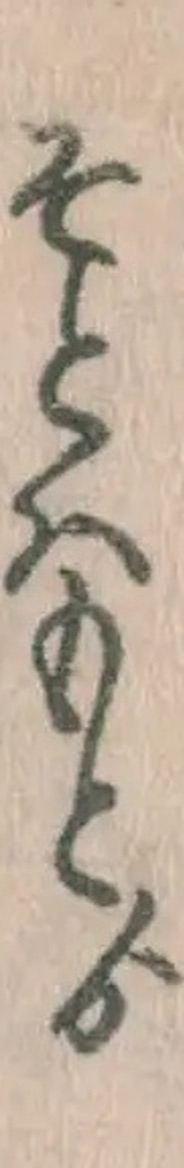そとはもとゟ
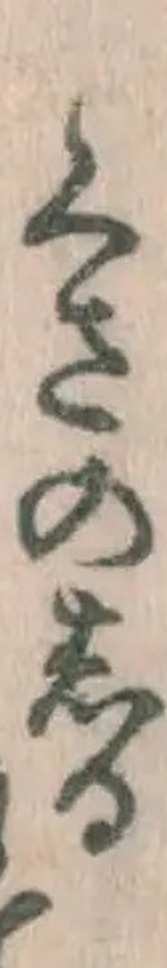くさのしるにて
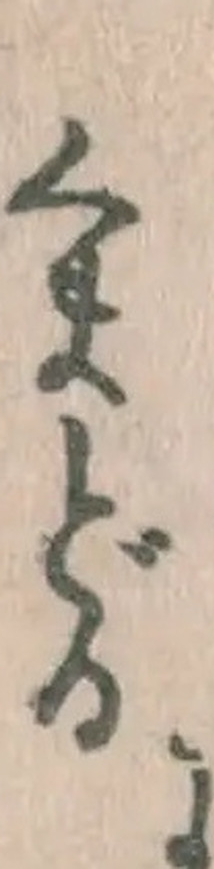くまどる

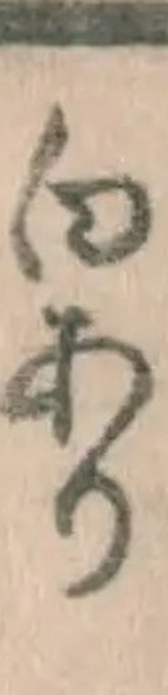白あり
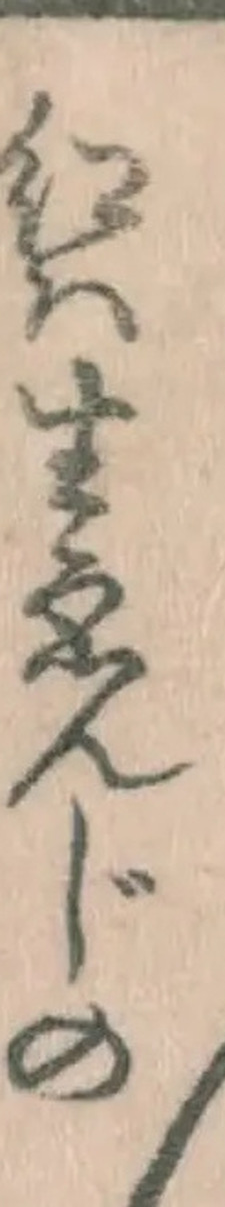紅は生ゑんじの
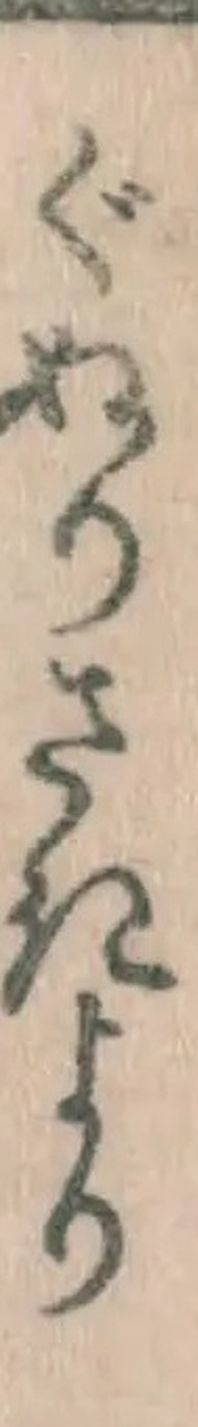ぐぬりさきより
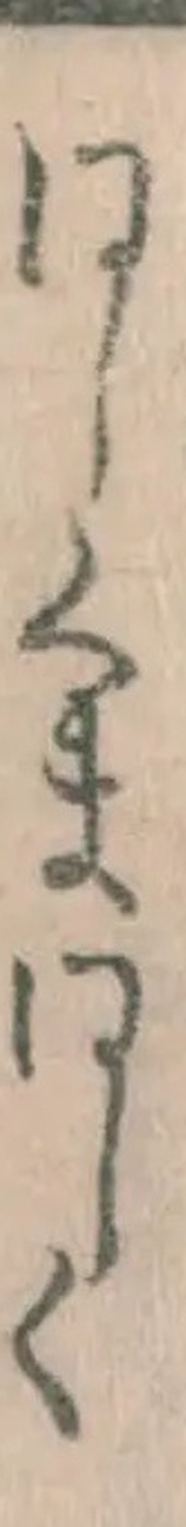同しくま同しく
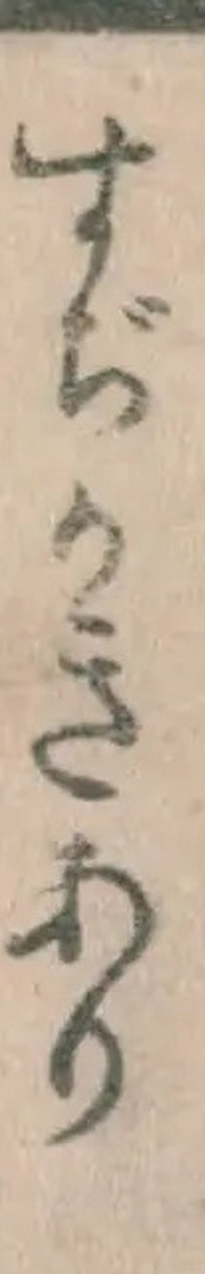すぢかきあり
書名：絵本時津艸
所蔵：国立国会図書館 National Diet Library, JAPAN
